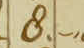8.
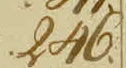246.
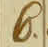6.
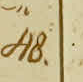48.
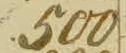500.
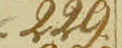229.
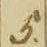5.
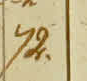72.
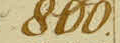800.
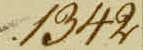1342
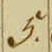5.
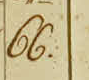66.
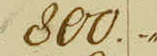800.
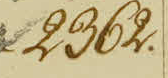2362.
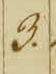3.
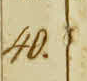40.
